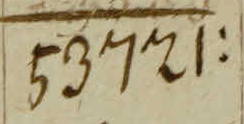53721:
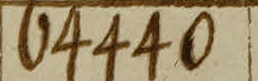64440
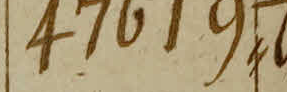47619
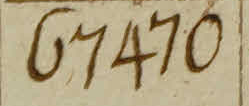67470
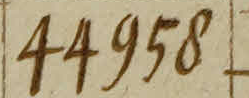44958
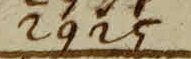2925
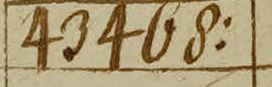43468:
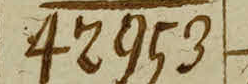42953
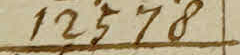12578
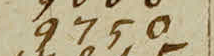9750
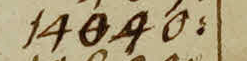14040:
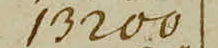13200
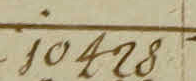10428
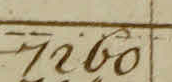7260
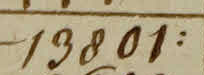13801
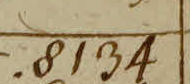8134
